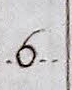6
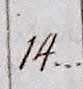14
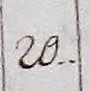20
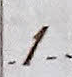1
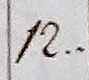12
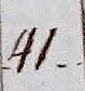41
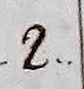2
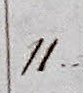11
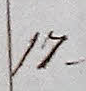17
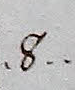8
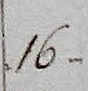16
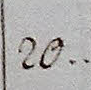20
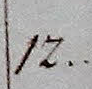12
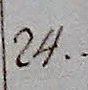24
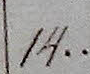14
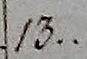13
